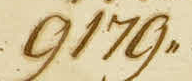9179
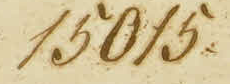15015
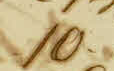10
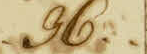36.
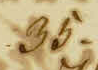35
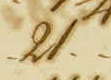21.
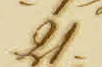21
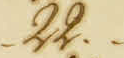22.
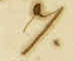7
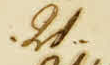21.
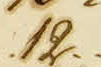12
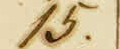15.
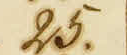25.
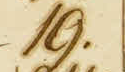19.
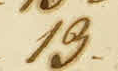13
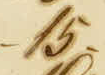15
